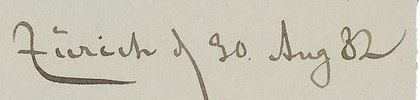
Zürich d 30 Aug 82
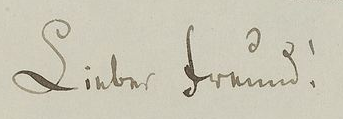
Lieber Freund!
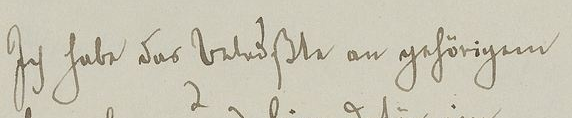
Ich habe das Bewußte an gehörigem
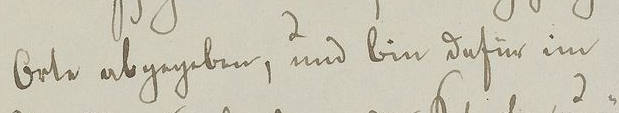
Orte abgegeben, und bin dafür im
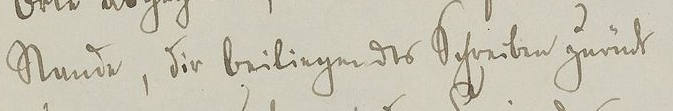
Stande, dir beiliegendes Schreiben zurück
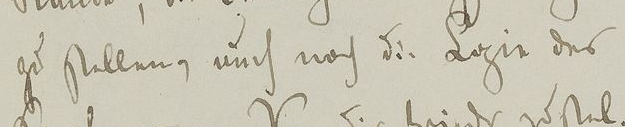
zu stellen, auch noch die Copie des
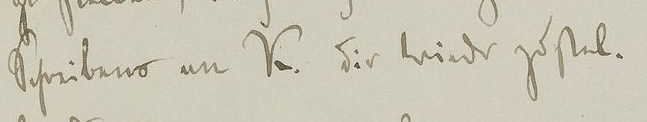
Schreibens an K. dir wieder zustel-
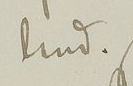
lend.
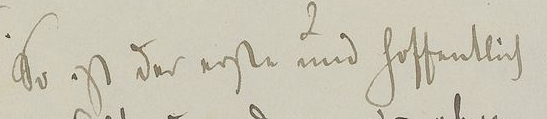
So ist der erste und hoffentlich
